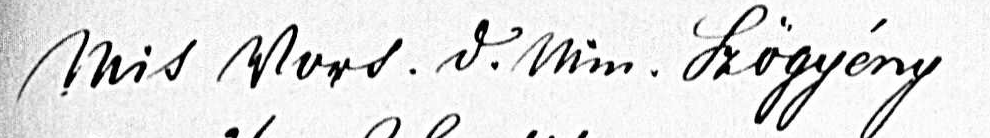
Mit Vort. d. Min. Szögyény
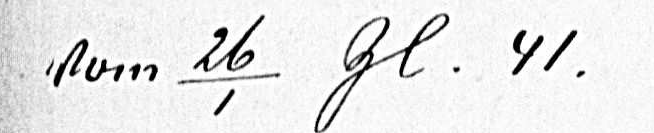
vom 26/1 Zl. 41
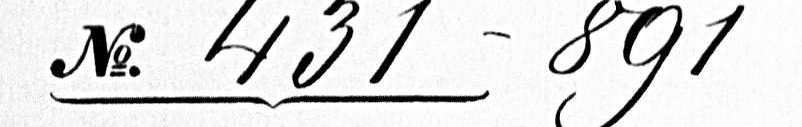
No. 431 – 1891
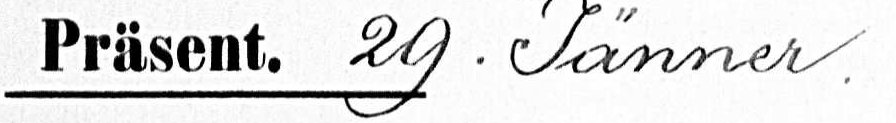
Präsent. 29 Jänner
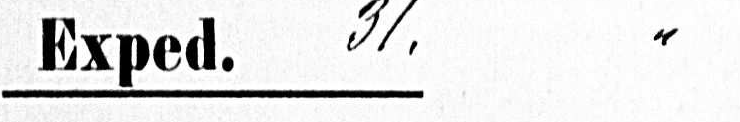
Expedit 31. Jänner
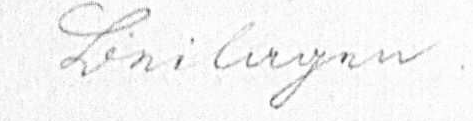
Beilagen
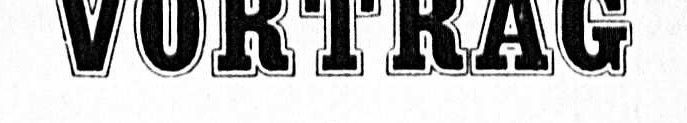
VORTRAG
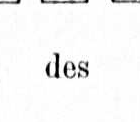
des
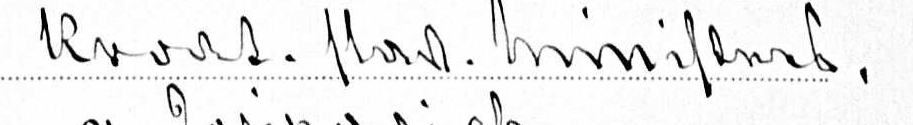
kroat. slav. Ministers
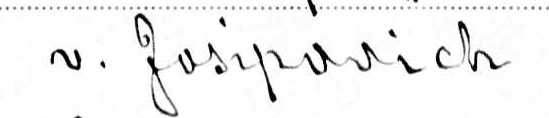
v. Josipovich
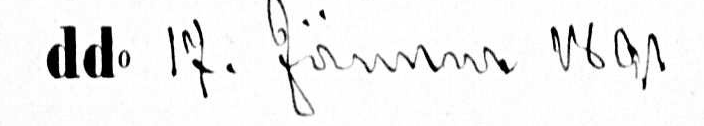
Ddo 17. Jänner 1891
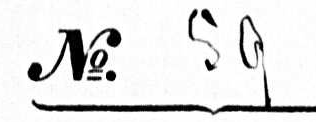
No. 59
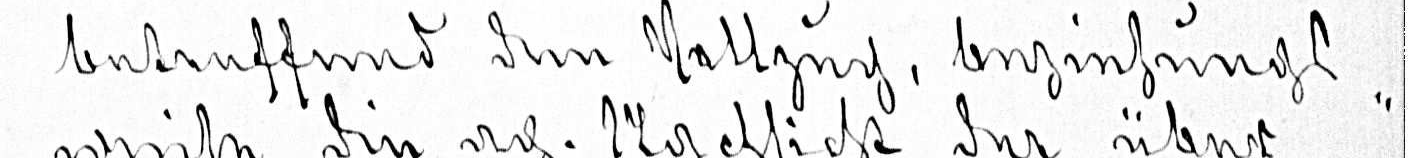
Betreffend den Vollzug, beziehungs¬
